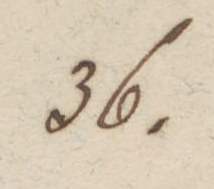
36.
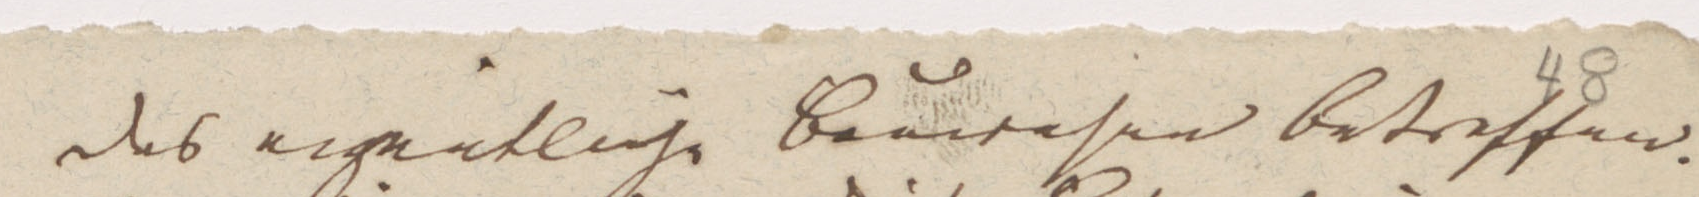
das eigentliche Bauwesen betreffen.
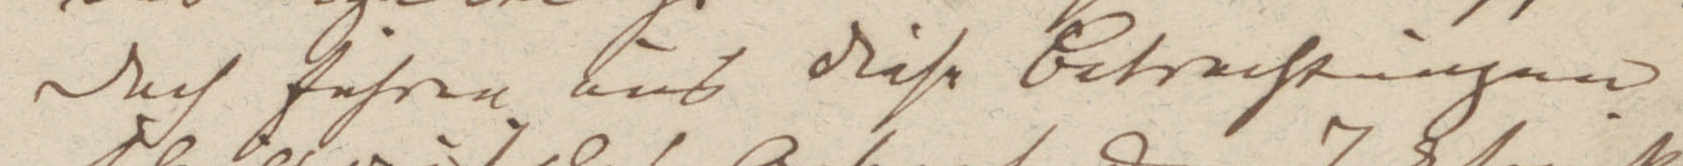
Doch führen uns diese Betrachtungen
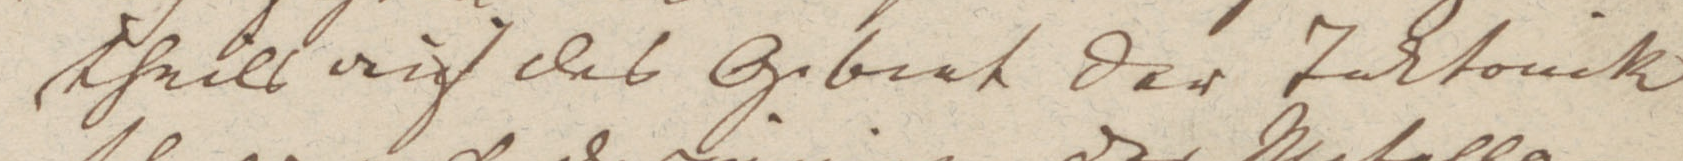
theils auf das Gebiet der Tektonik
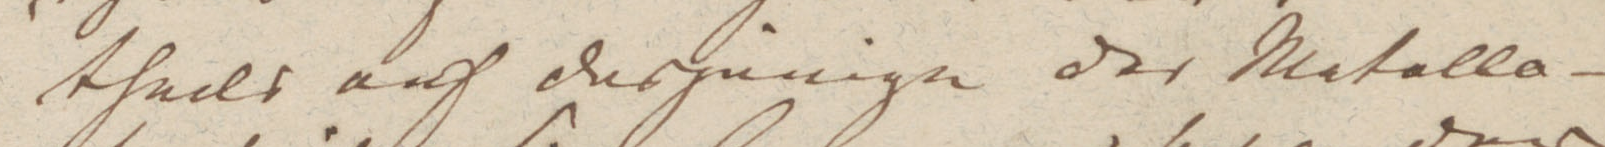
theils auf dasjenige der Metallo-
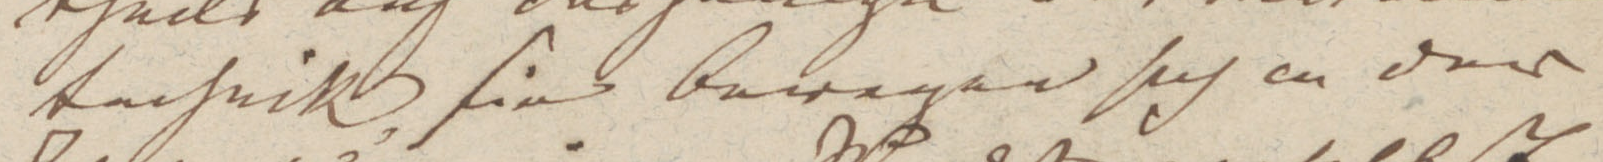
technik, sie bewegen sich in der
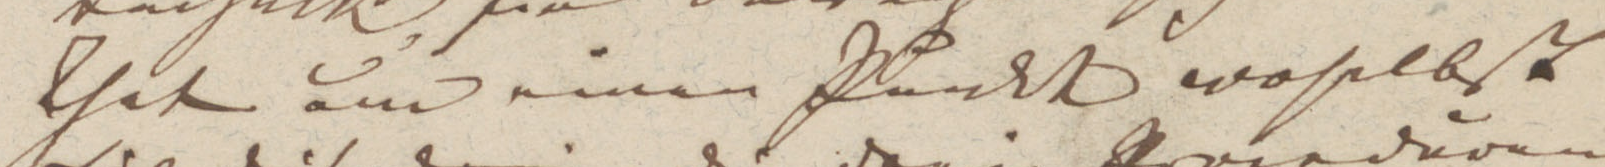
That um einen Punkt woselbst
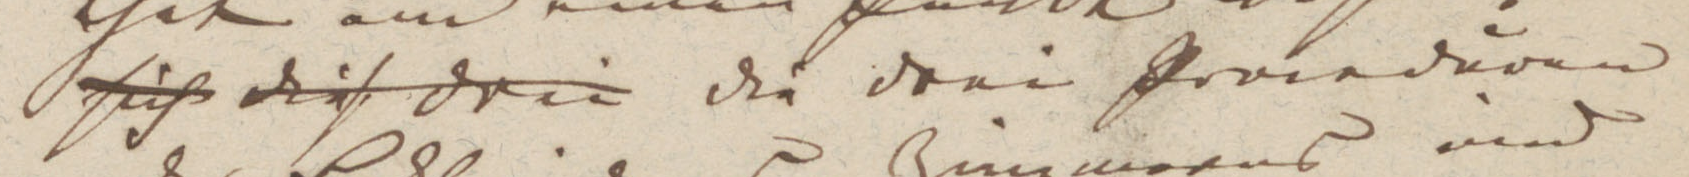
sich dies drei die drei Proceduren
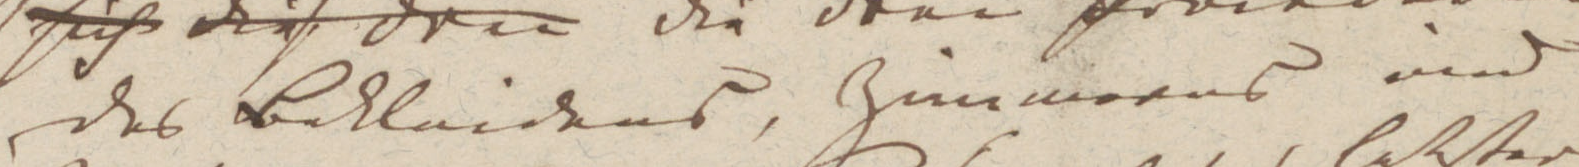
des Bekleidens, Zimmerns und
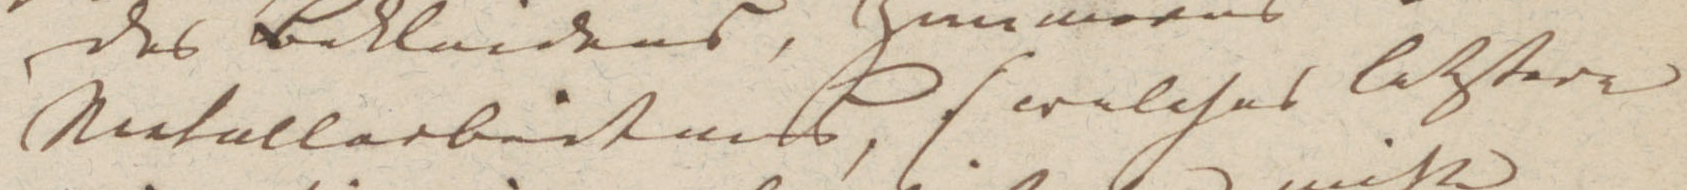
Metallarbeitens, (welches letztere
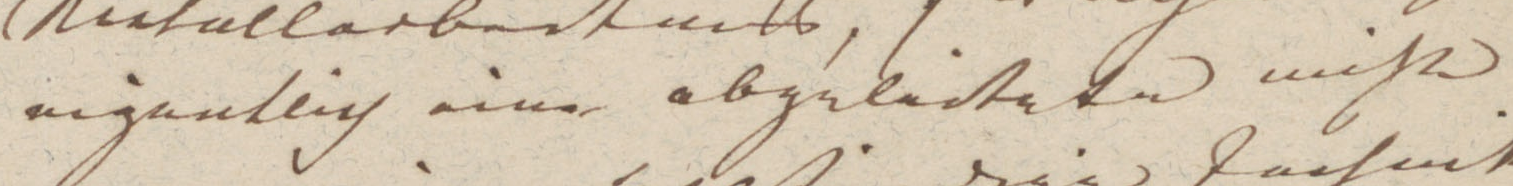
eigentlich eine abgeleitete nicht
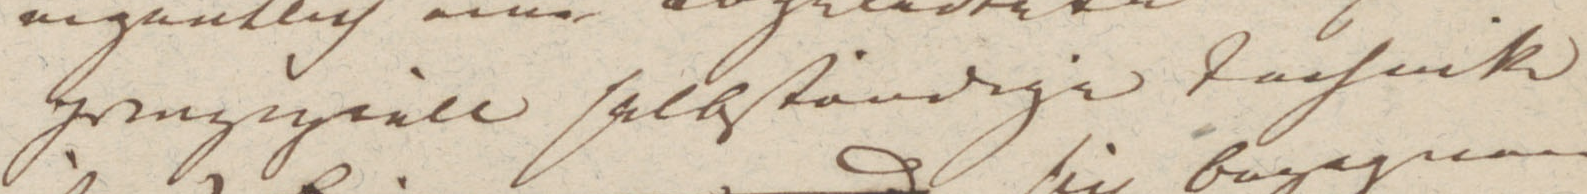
prinzipiell selbständige Technik
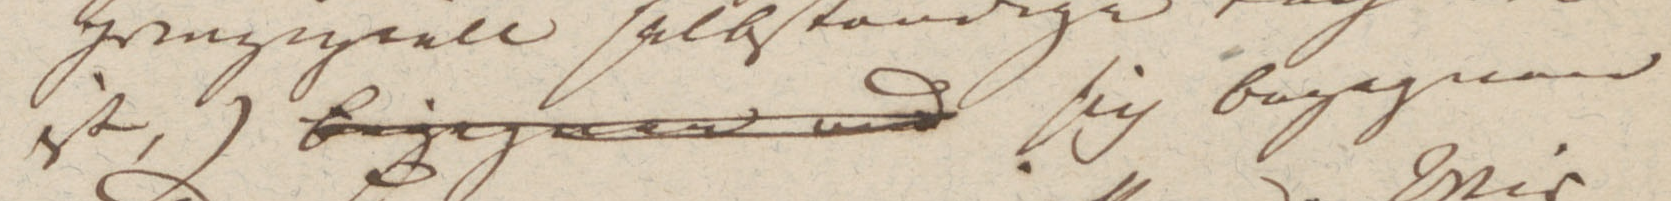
ist,) begegnen und sich begegnen
